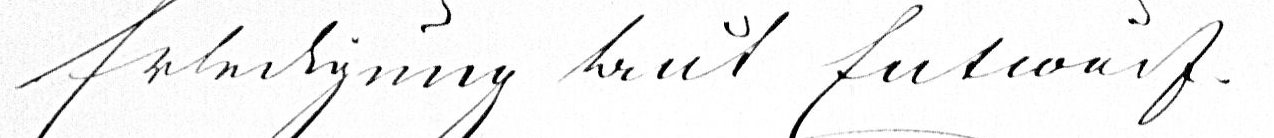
Erlerdigung laut Entwurf.
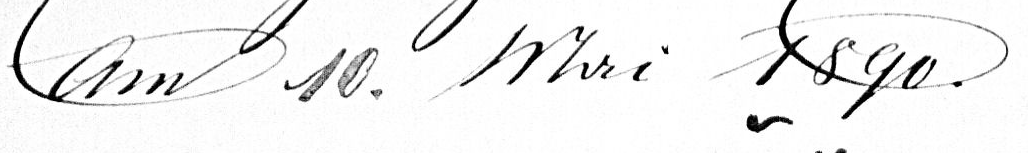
Am 10. Mai 1890.
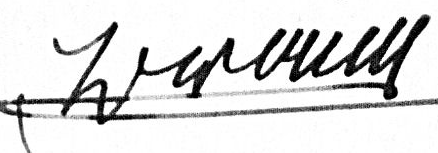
xx
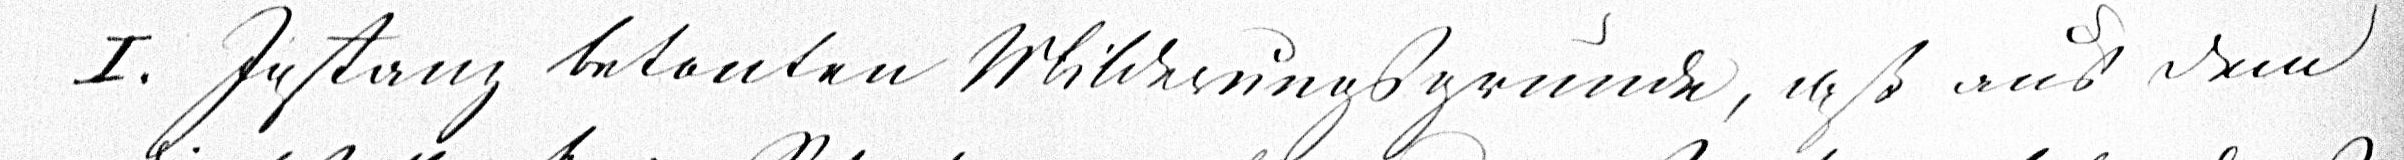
I. Justanz betonten Milderungsgrunde, daß aus dem
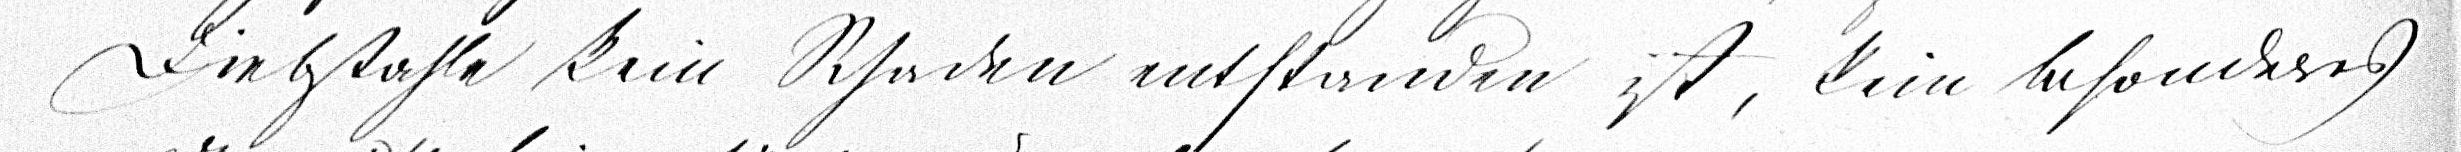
Diebstahle kein Schaden entstanden ist, kein besonderes
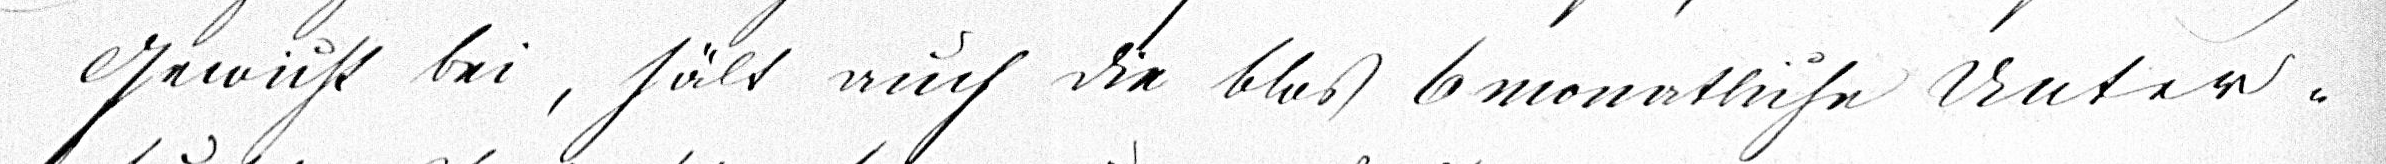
Gewicht bei, hält auch die blos 6 monatliche Unter¬
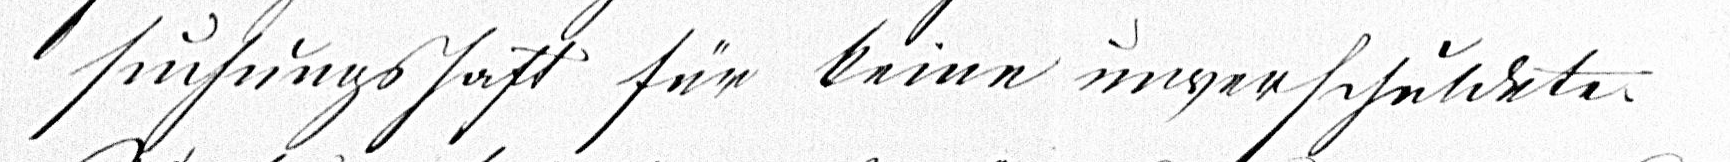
suchungshaft für keine unverschuldete.
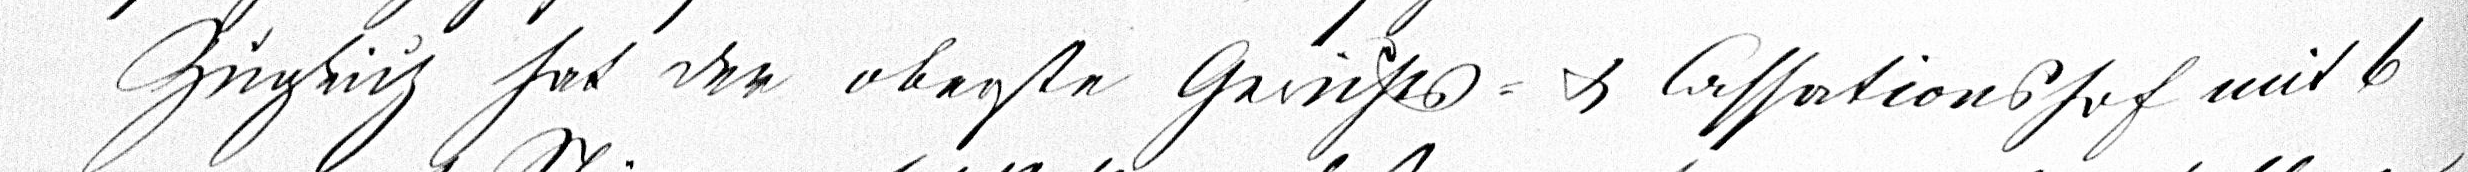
Zugleich hat der oberste Gerichts- & Cassationshof mit 6
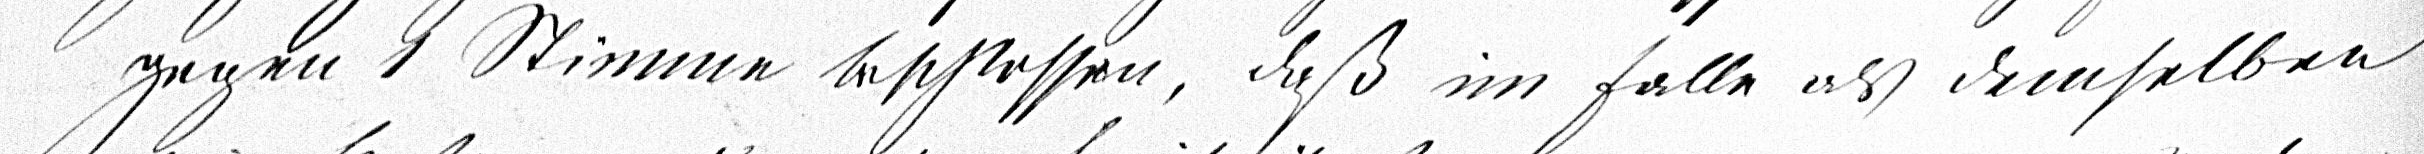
gegen 1 Stimme beschlossen, daß im Falle als demselben
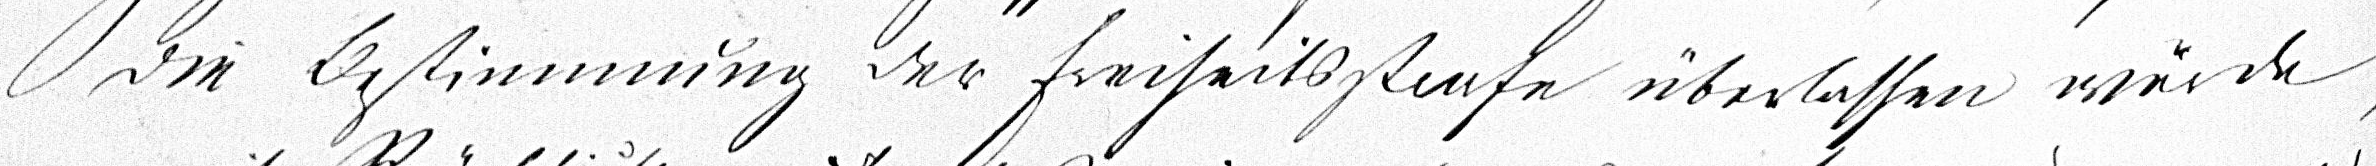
die Bestimmung der Freiheitsstrafe überlassen würde,
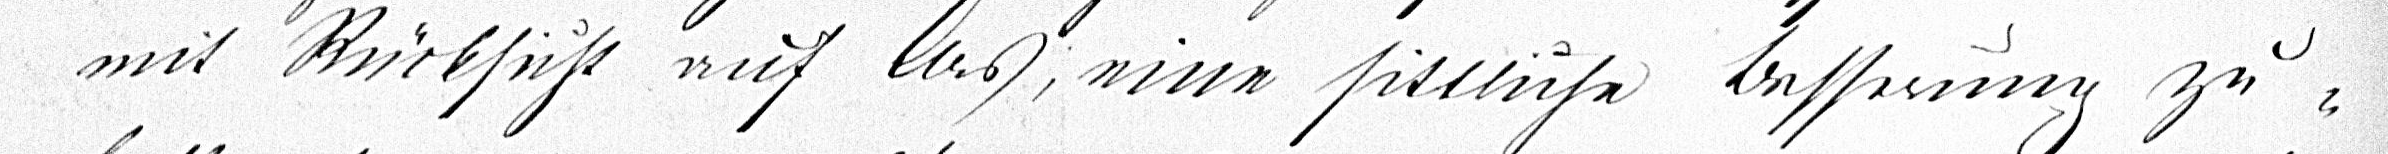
mit Rücksicht auf das, eine sittliche Besserung zu¬
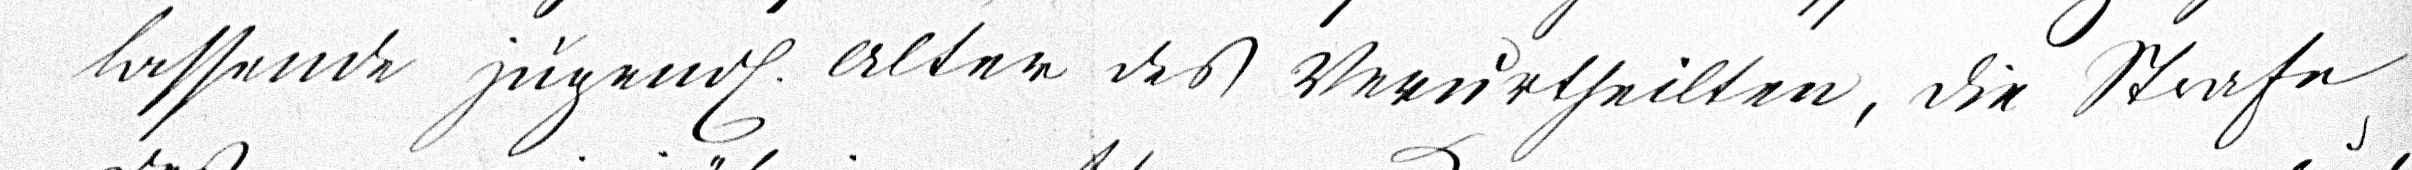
lassende jugend. Alter des Verurtheilten, die Strafe
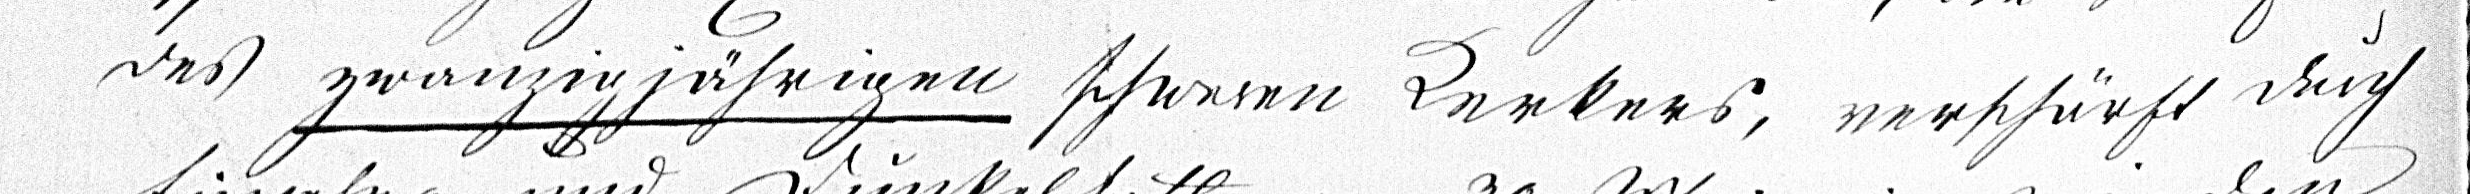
des zwanzigjährigen schweren Kerkers, verschärft durch
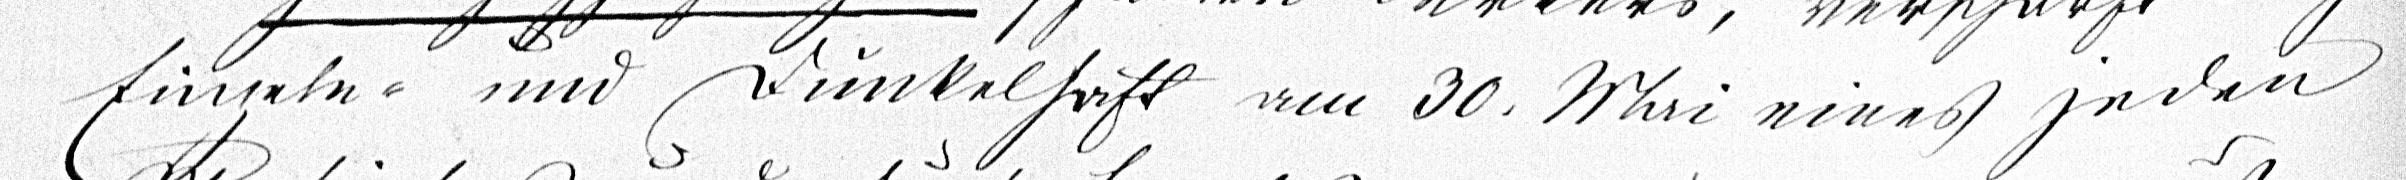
Einzeln- und Dunkelhaft am 30. Mai eines jeden
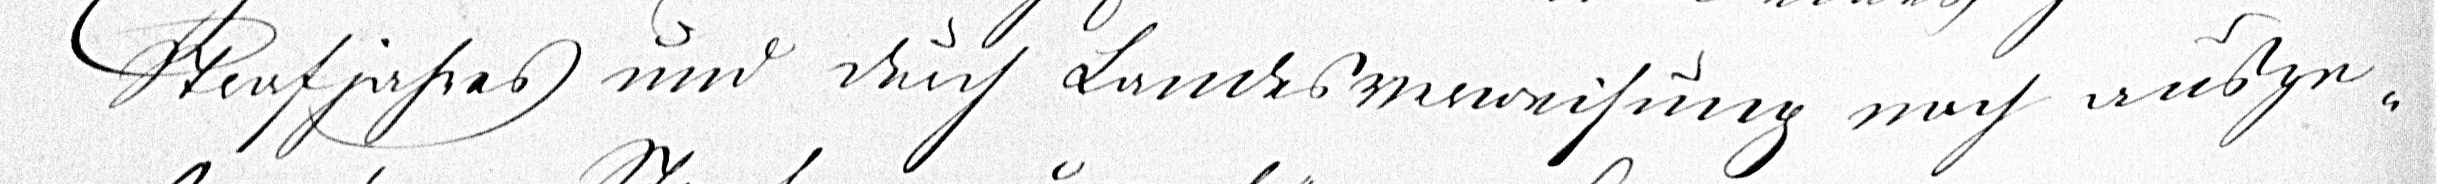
Strafjahres und durch Landesverweisung nach ausge¬
